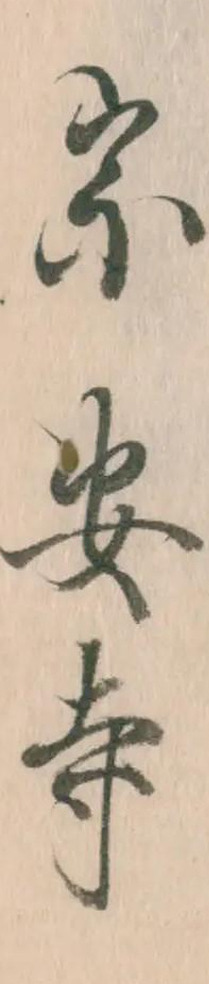宗安寺
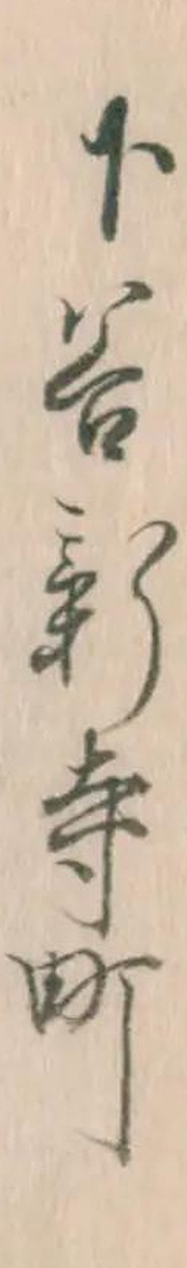下谷新寺町
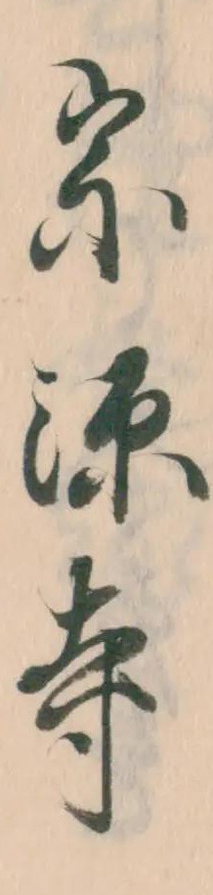宗源寺
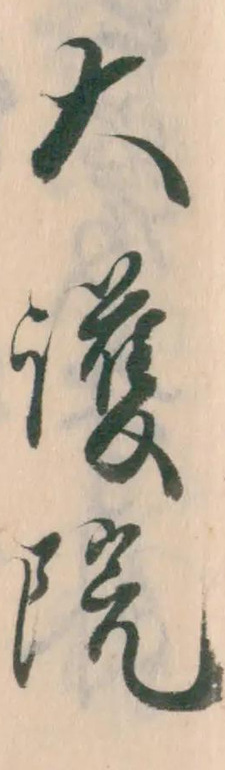大護院
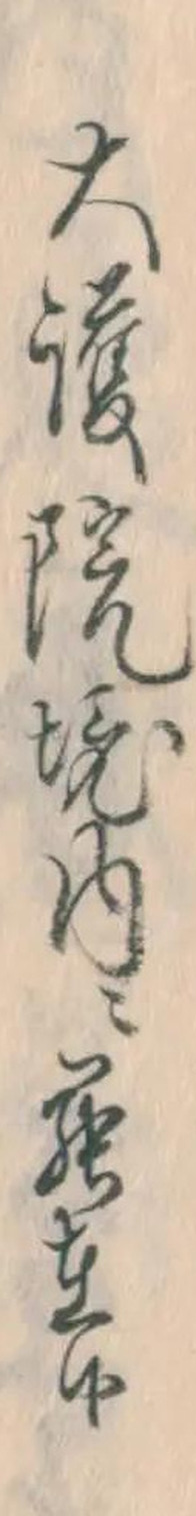大護院境内ニ罷在候
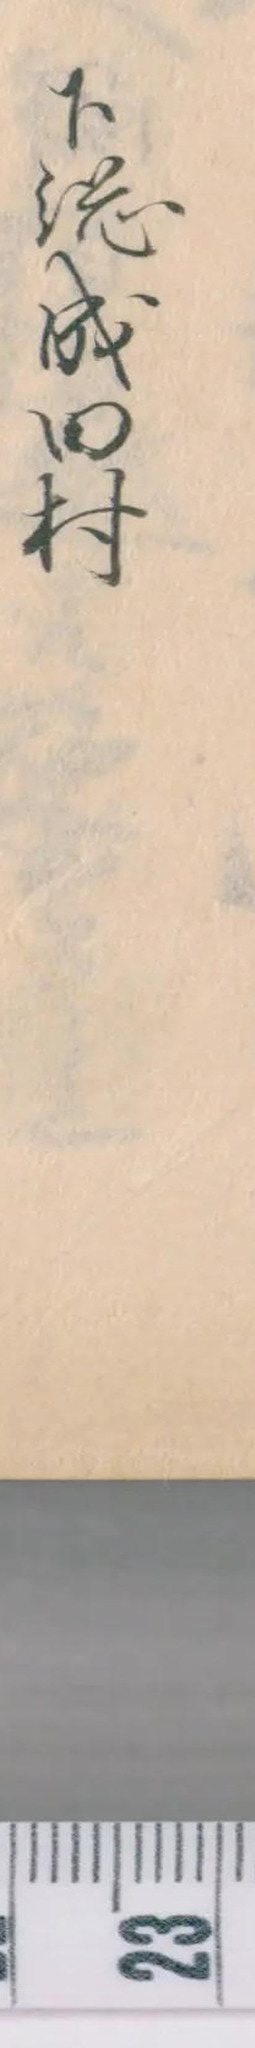下総成田村
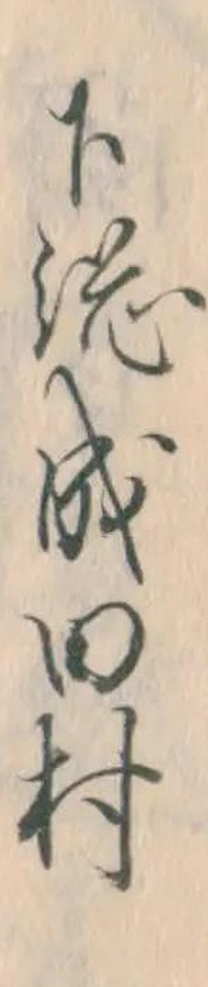下総成田村
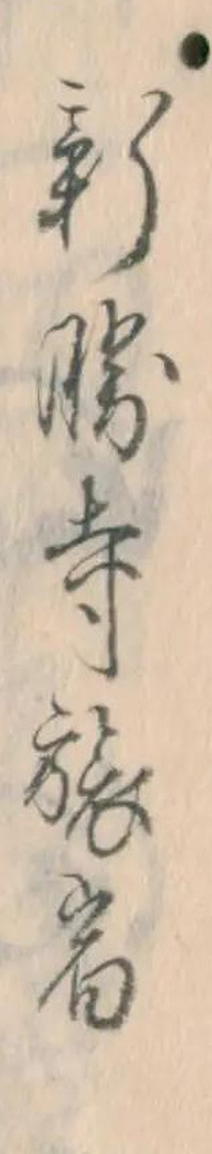新勝寺旅宿
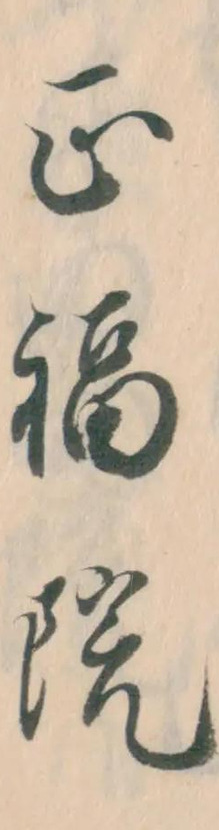正福院

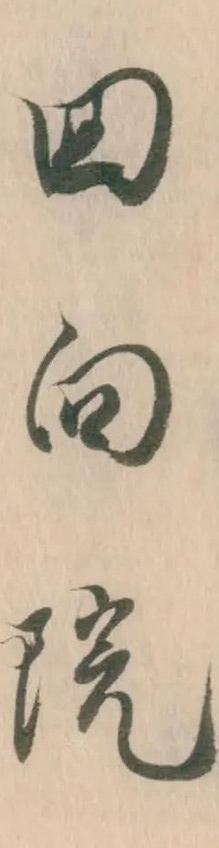回向院
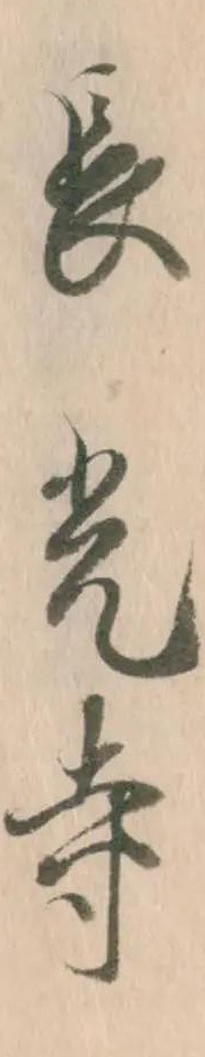長光寺
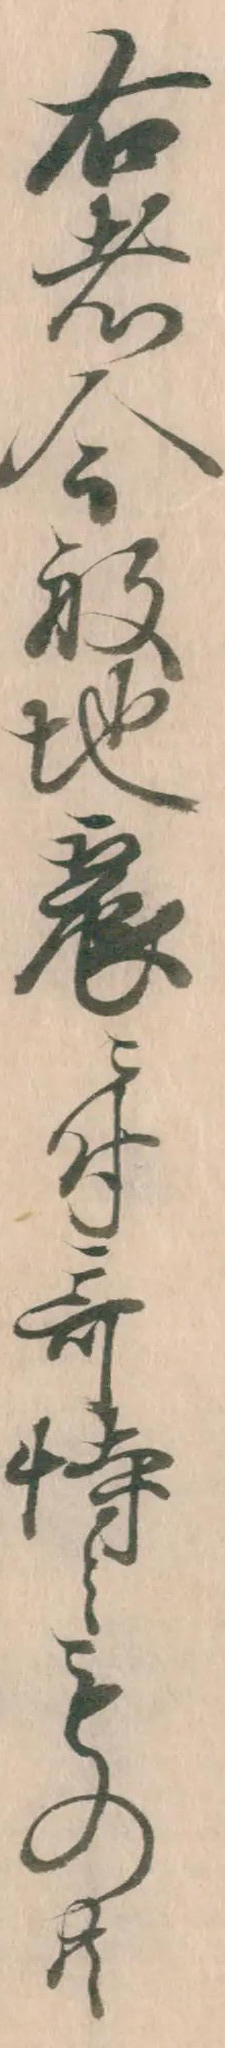右は今般地震ニ付奇特之もの共
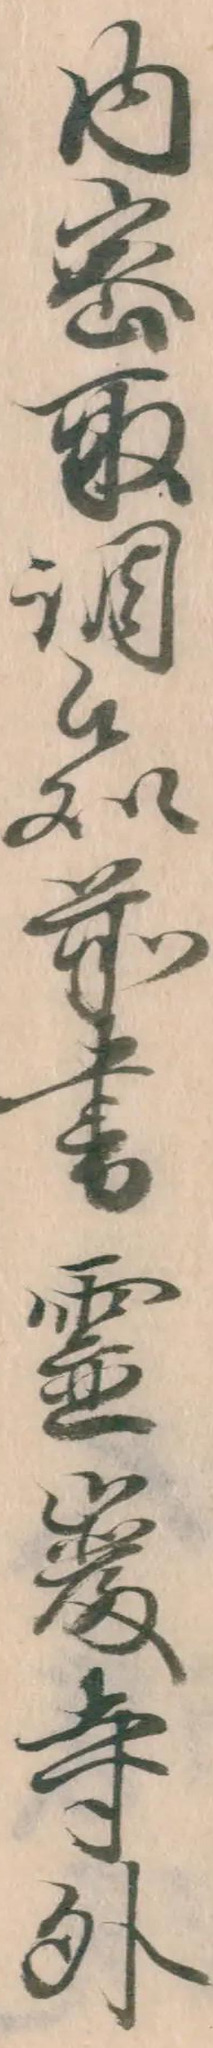内密取調候処前書霊巌寺外
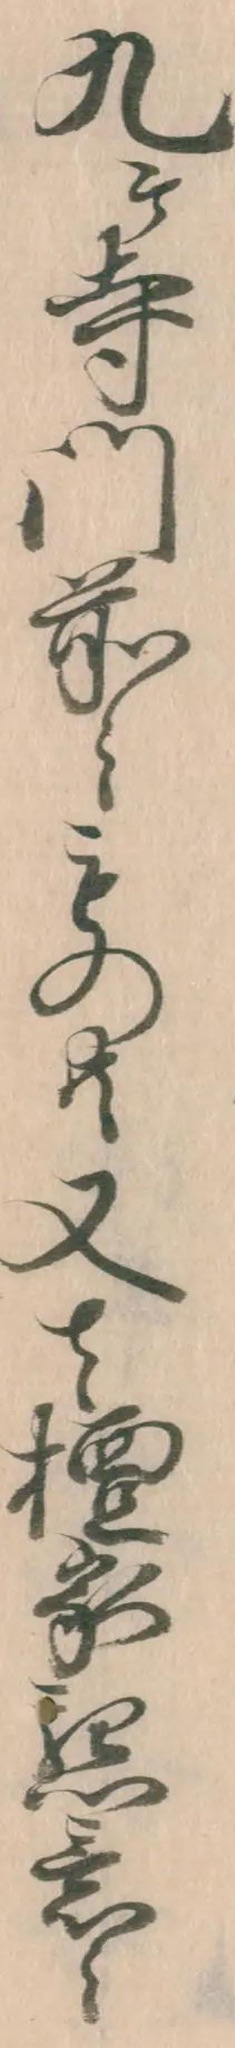九ケ寺門前之もの共又は檀家懇意之
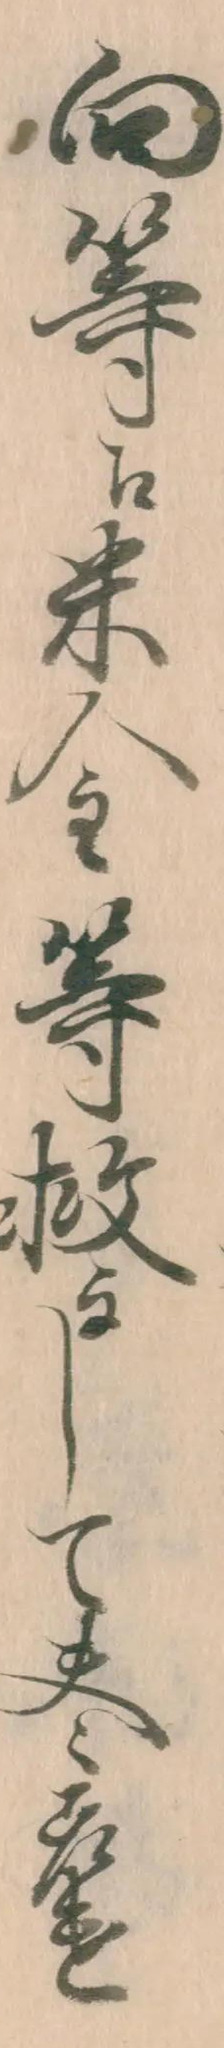向等え米金等救として夫々差遣
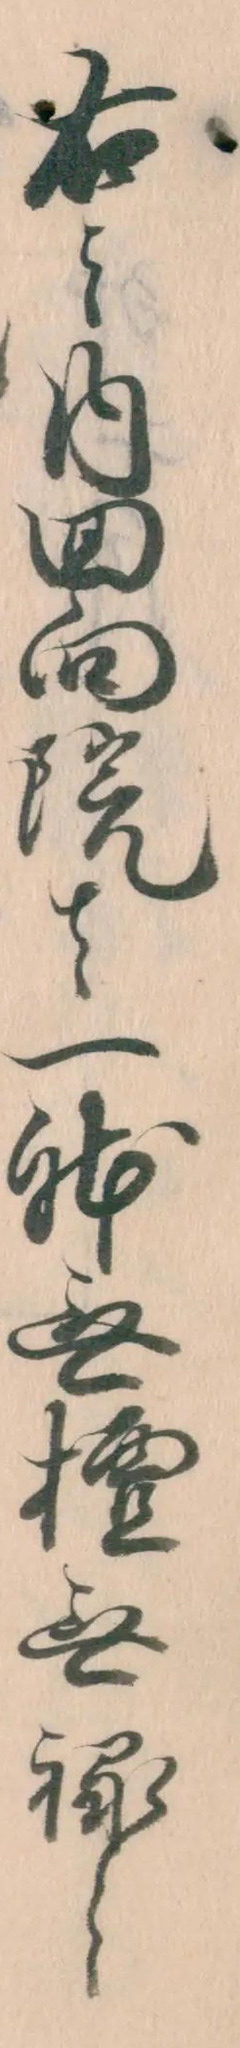右之内回向院は一躰無檀無縁之
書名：武家方并寺院等ニテ施差出候一件
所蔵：国立国会図書館 National Diet Library, JAPAN
